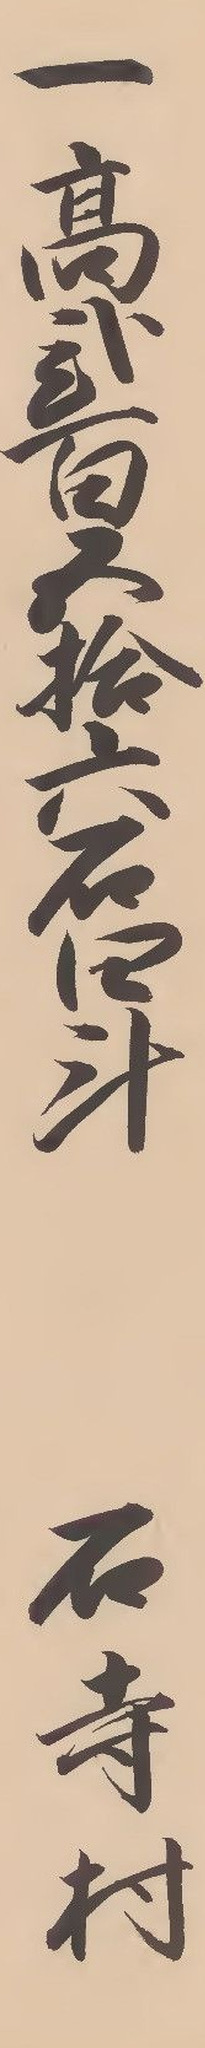一高弐百五拾六石四斗石寺村
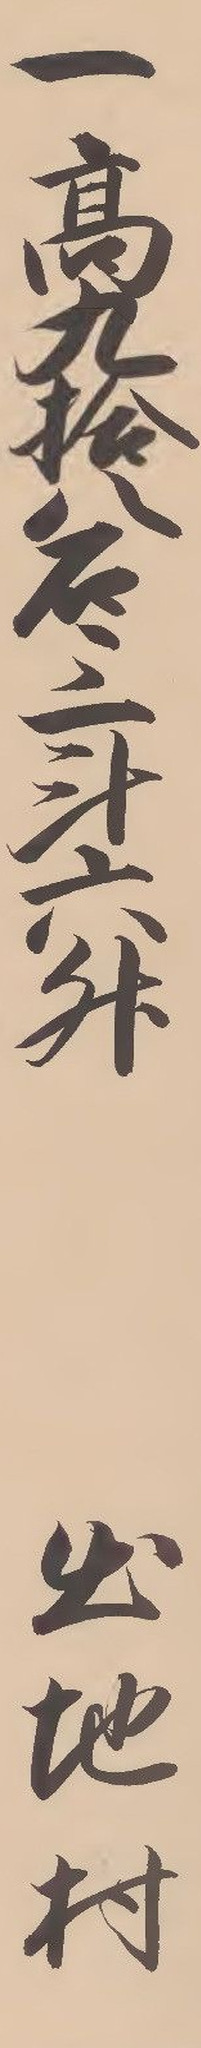一高九拾八石三斗六升出地村
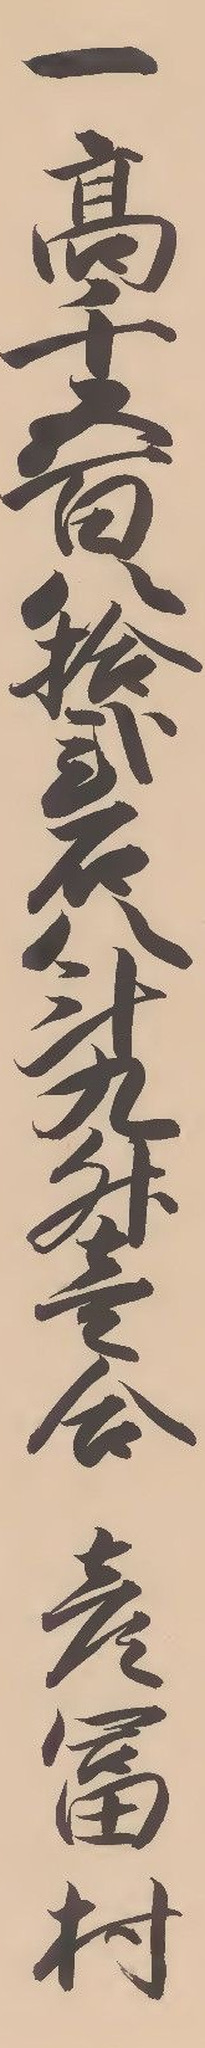一高千五百八拾弐石八斗九升壱合彦富村
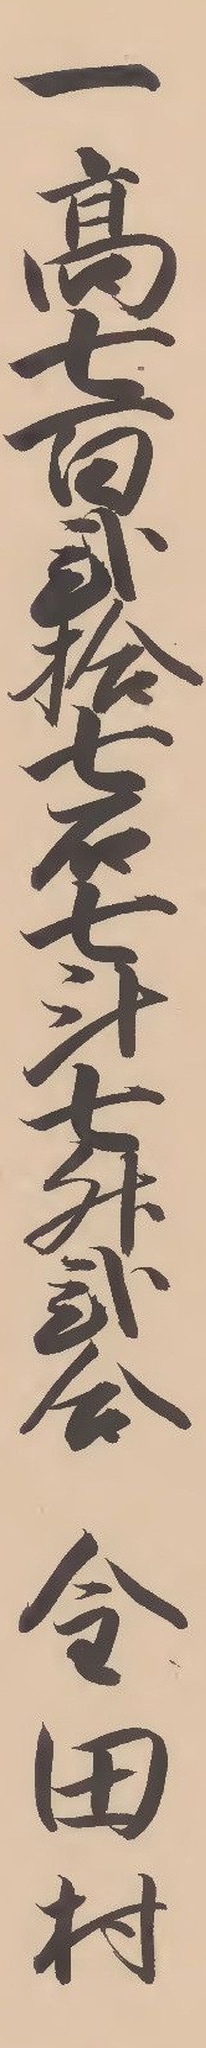一高七百弐拾七石七斗七升弐合金田村
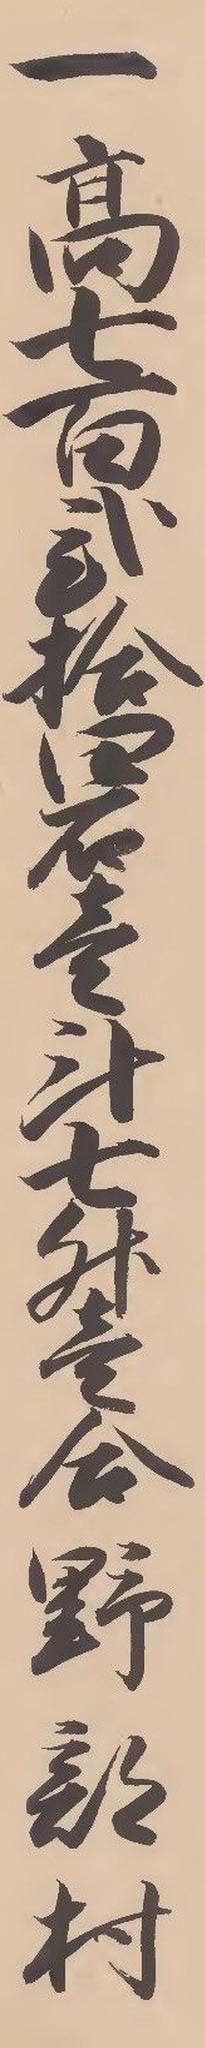一高七百弐拾四石壱斗七升壱合野部村

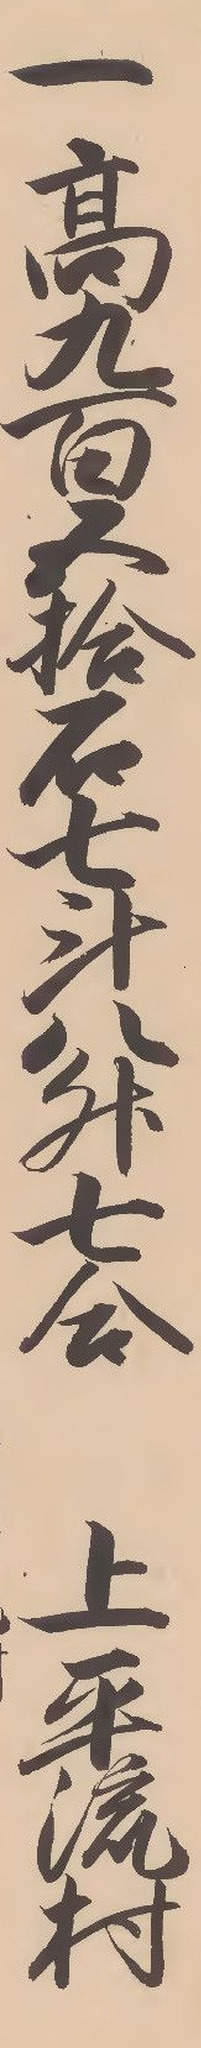一高九百五拾石七斗八升七合上平流村
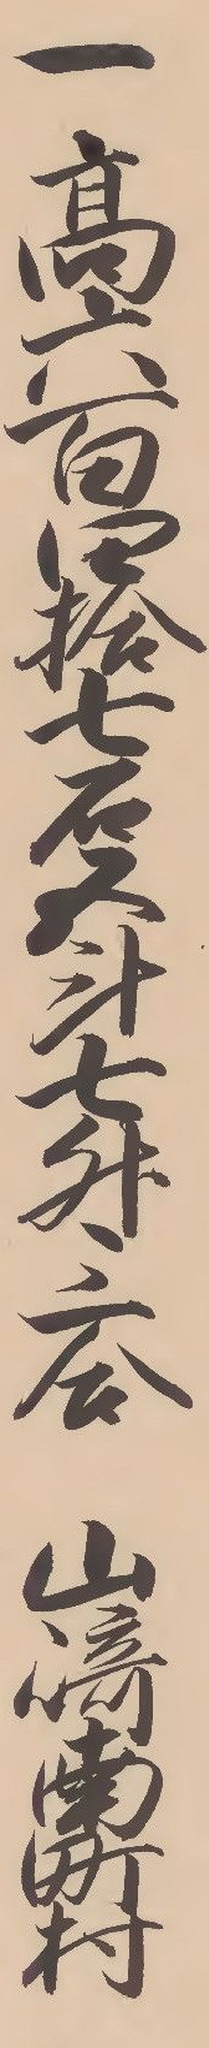一高六百四拾七石五斗七升三合山崎南町村
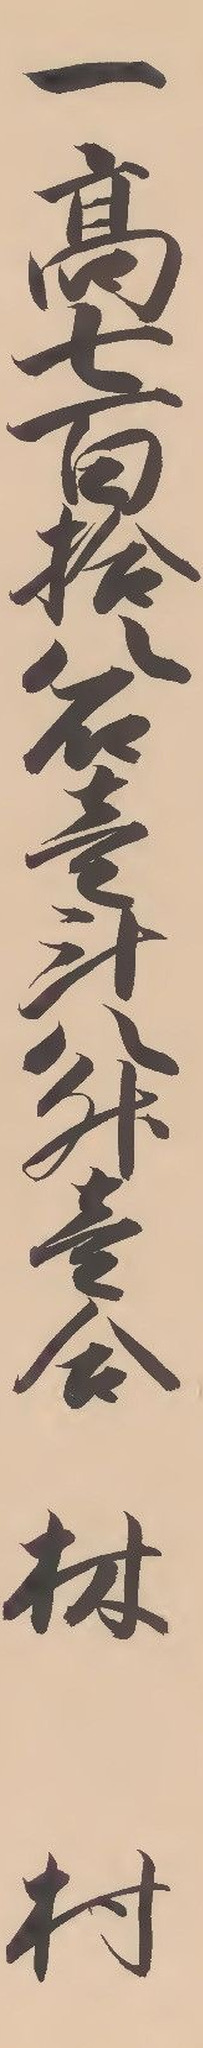一高七百拾八石壱斗八升壱合林村
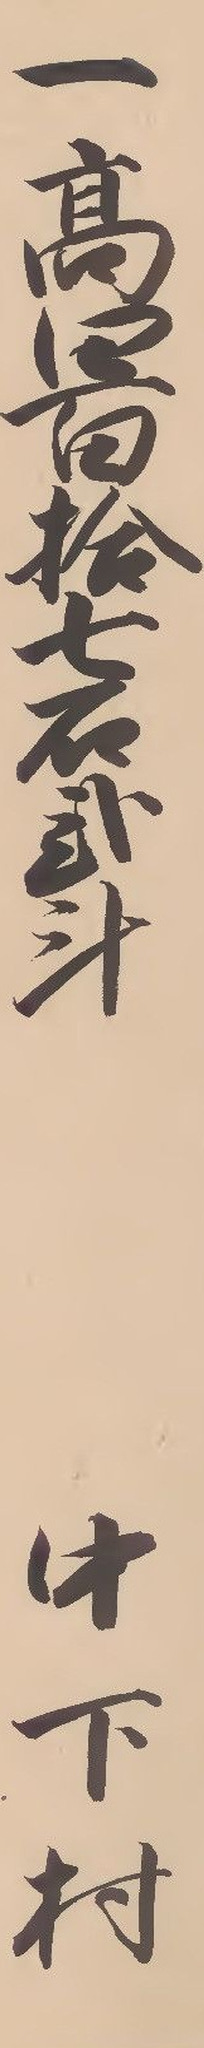一高四百拾七石弐斗中下村
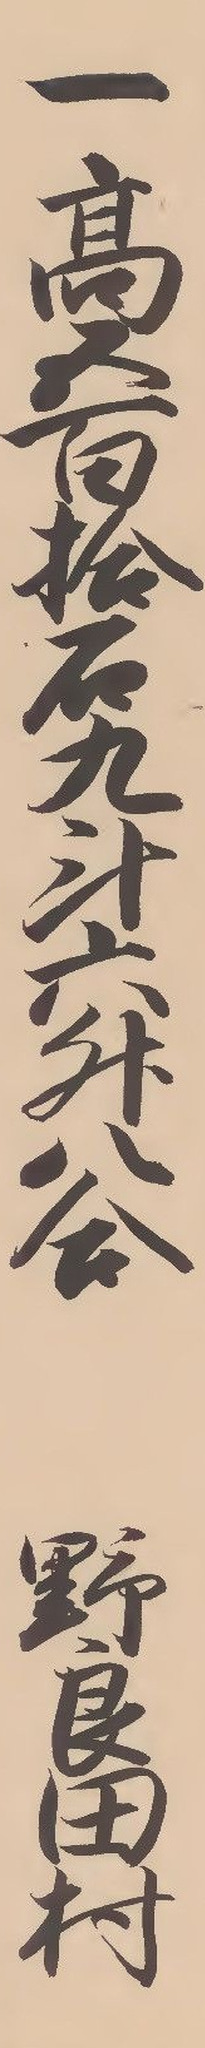一高五百拾石九斗六升八合野良田村
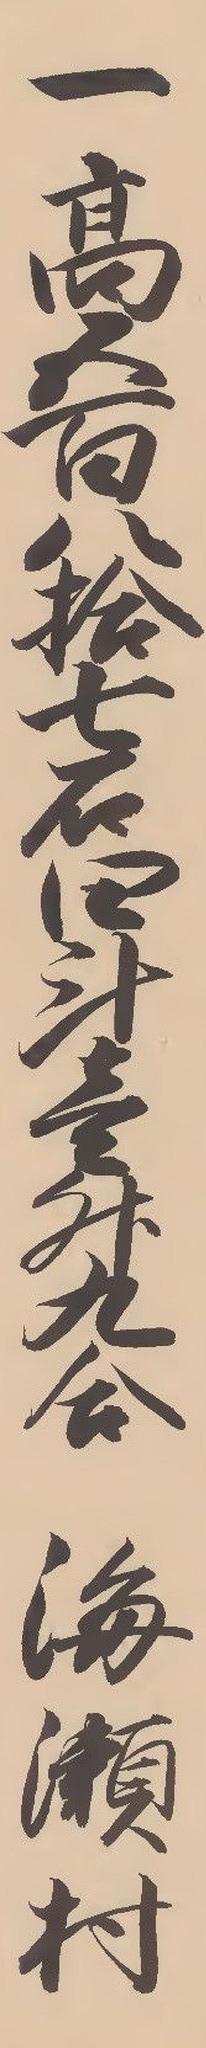一高五百八拾七石四斗壱升九合海瀬村

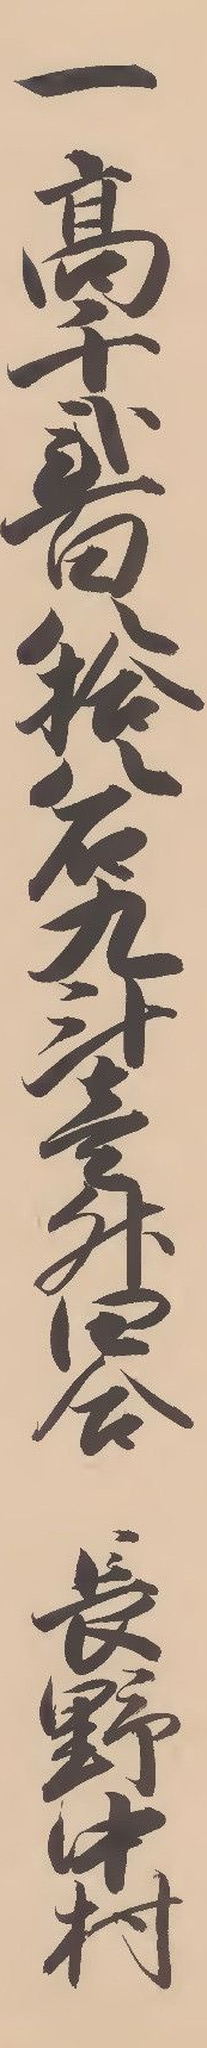一高千弐百八拾八石九斗壱升四合長野中村
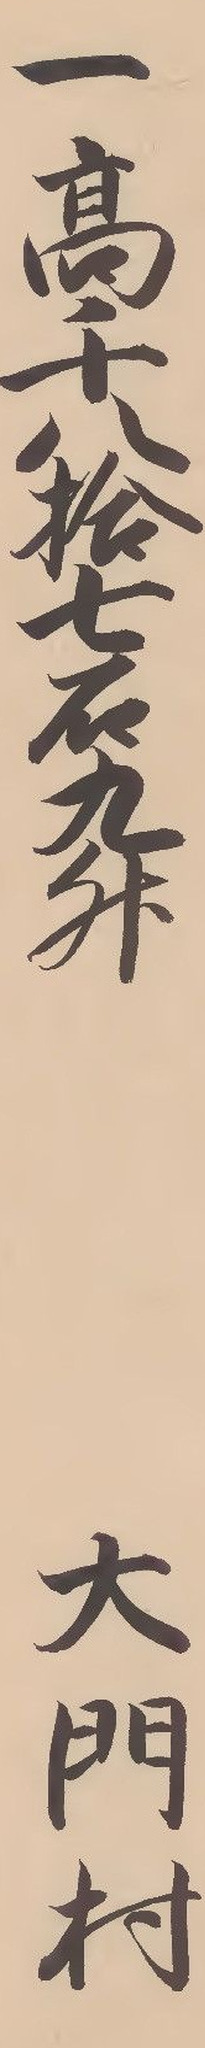一高千八拾七石九升大門村
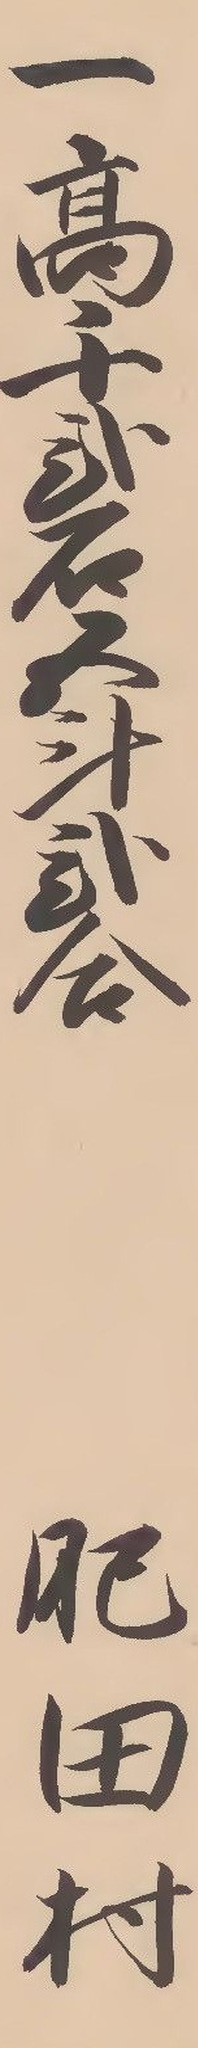一高千弐石五斗弐合肥田村
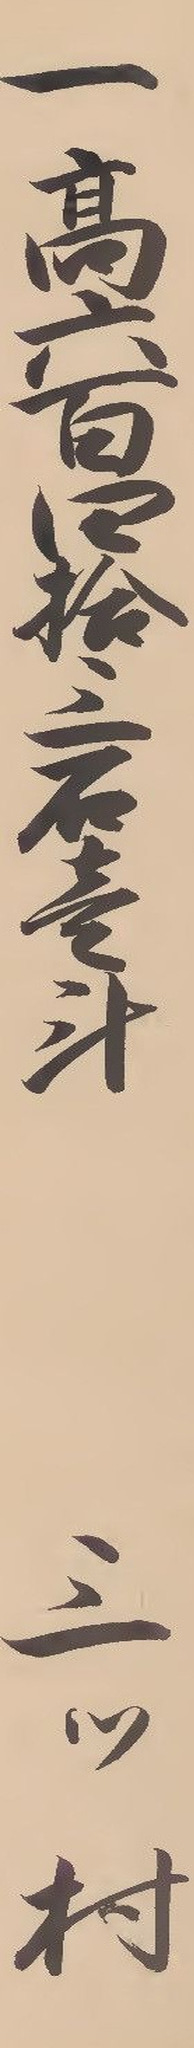一高六百四拾三石壱斗三ツ村
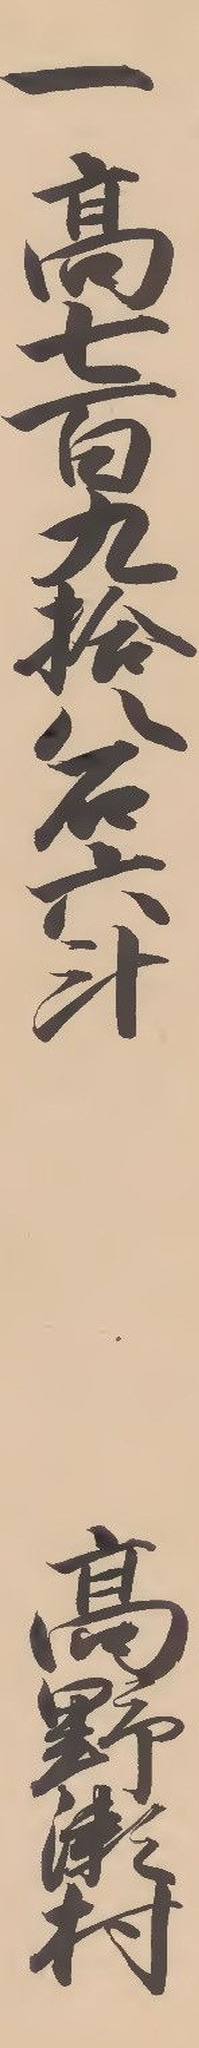一高七百九拾八石六斗高野瀬村
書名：近江国郷帳
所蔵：国立公文書館 National Archives of Japan
